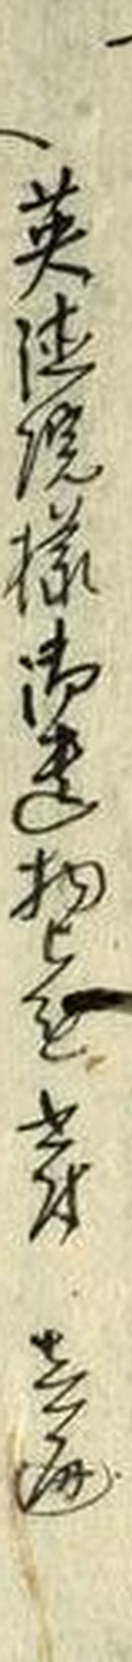英徳院様御遺物被進書付壱通
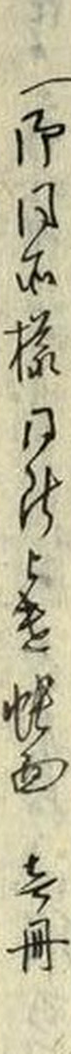御同所様同断被遣帳面壱冊
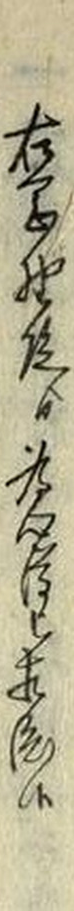右岡野殿ゟ為心得被相渡候
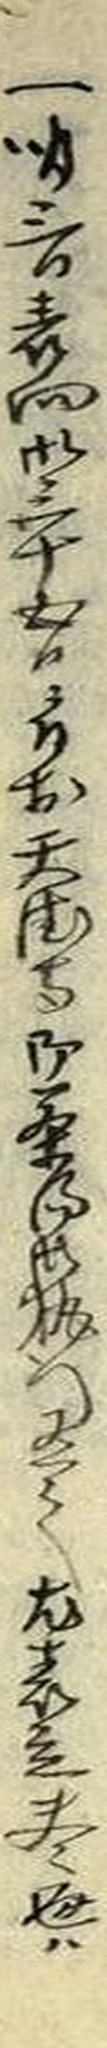一明三日表向御三十五日ニ付於天徳寺御茶湯御執行有之尤表立夫々通ハ
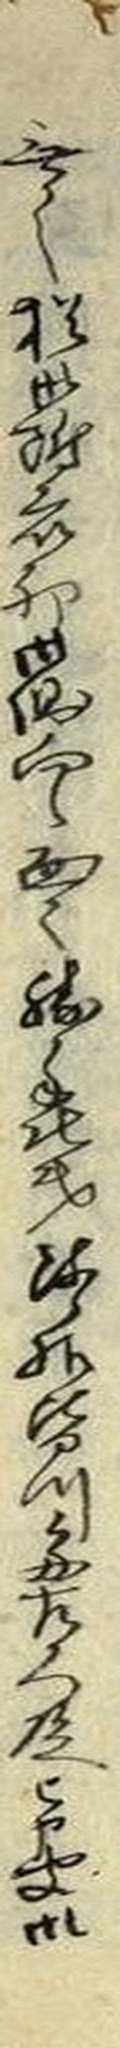無之猶御附衆初御側向之面々勝手次第致候様皆川多左衛門殿被申聞御
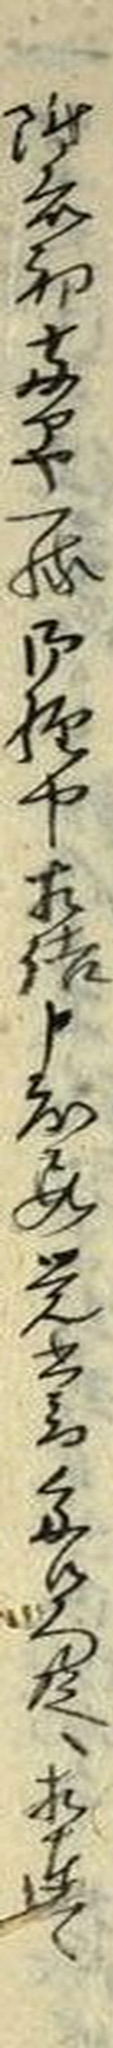附衆初両部ヤ一統御経中相詰申度段覚書ニ而多左衛門殿へ相達候

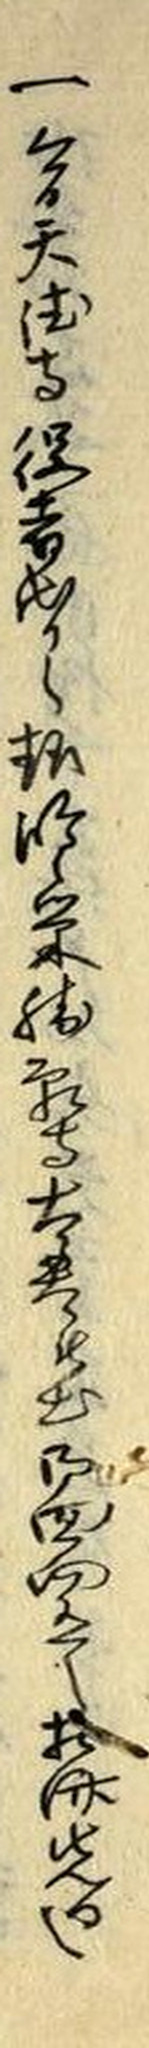一今日天徳寺役者代り之趣鴻巣勝願寺大奥へ罷出御回向有之相済先日之
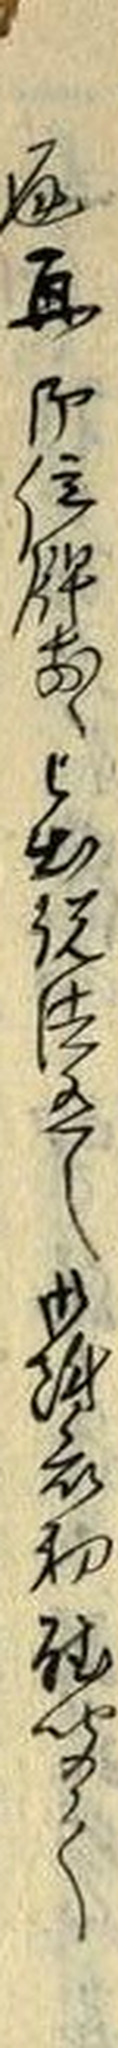通再御位牌前へ被出説法有之御附衆初聴聞之
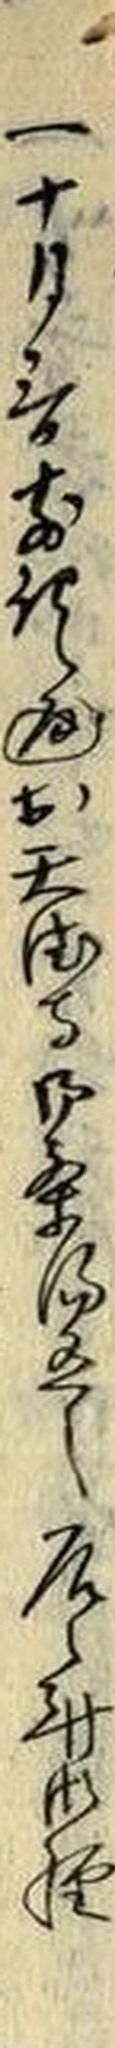一十月三日前記之通於天徳寺御茶湯有之辰之刻御経
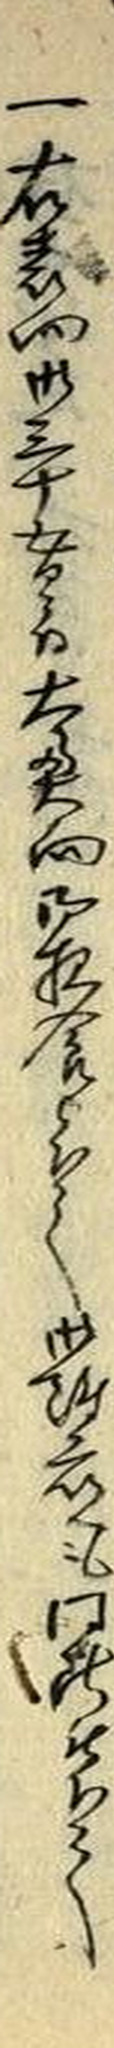一右表向御三十五日ニ而大奥向御夜食被下之御附衆へも同断被下之
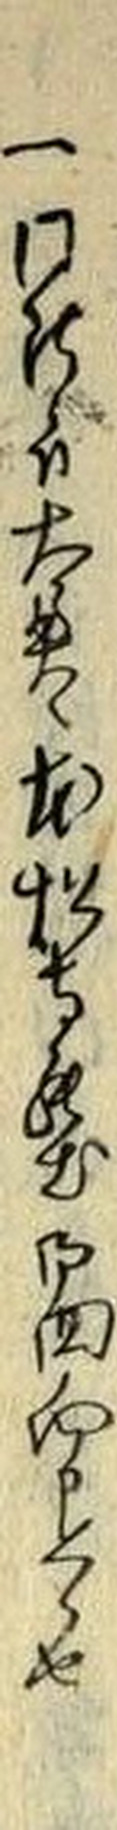一同断ニ付大奥へ本松寺罷出御回向申上候由
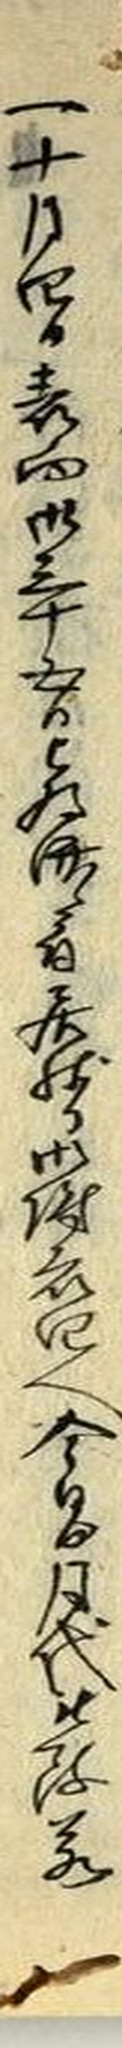一十月四日表向御三十五日被為済候ニ付居残り御附衆四人今日ゟ月代被致若
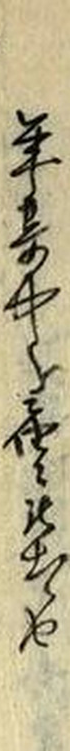年寄中之届ニ罷出候由
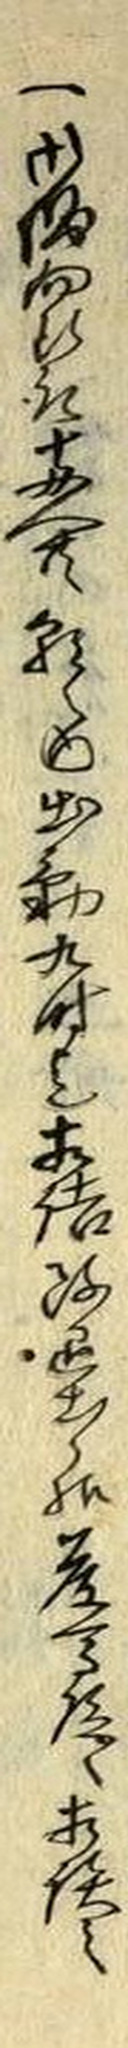一御側向頭取両人共朝之内出勤九時迄相詰致退出候様藤馬殿へ相談之
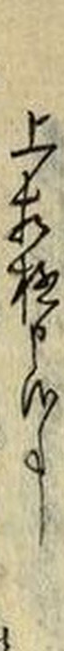上相極申候事
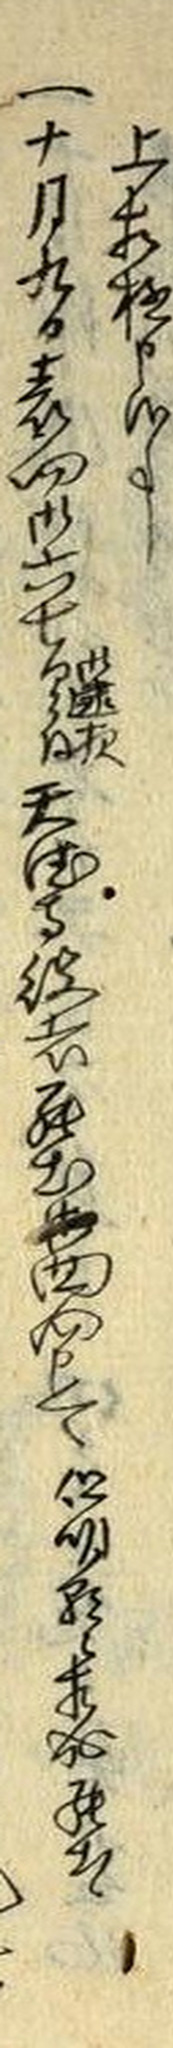一十月九日表向御六七日御逮夜ニ付天徳寺役者罷出御回向申上候但明朝ニ相成罷出候
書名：少傅日録抄（斉善付側向頭取日記、江戸并道中、初入在国、逝去後…
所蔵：福井県文書館 Fukui Prefectural Archives
